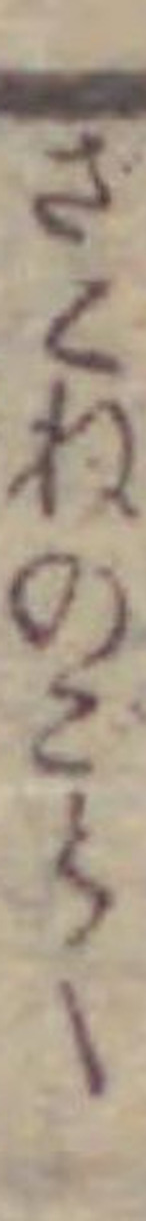さこねのことく
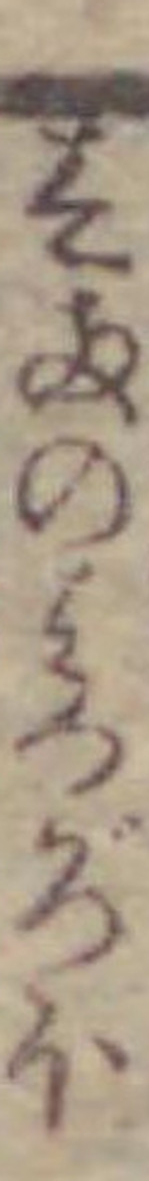すまのはつがつほ
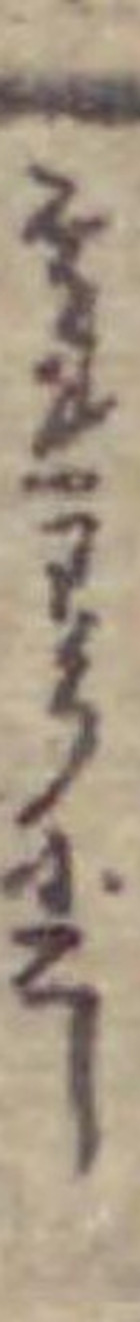それわちにこし
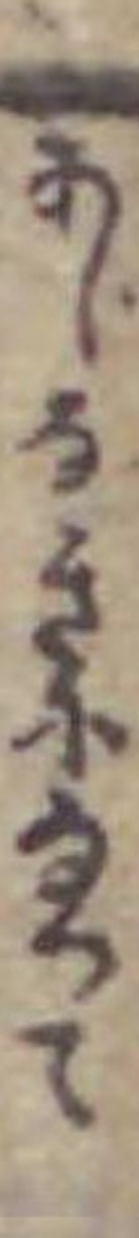あじなきになつて
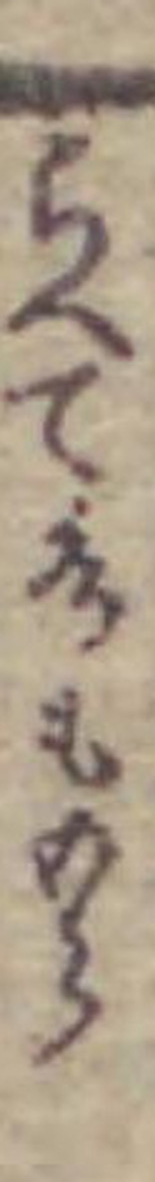らへて水ももら
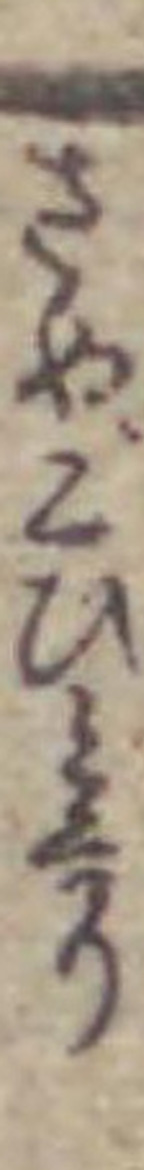さぬこひとなり
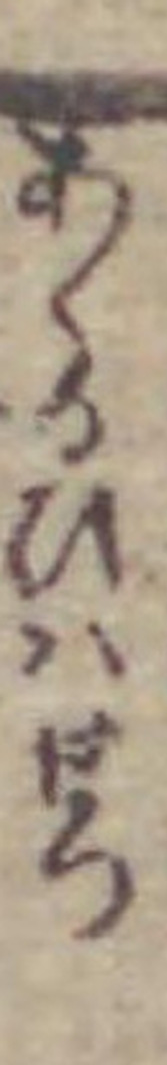あくるひはせつ
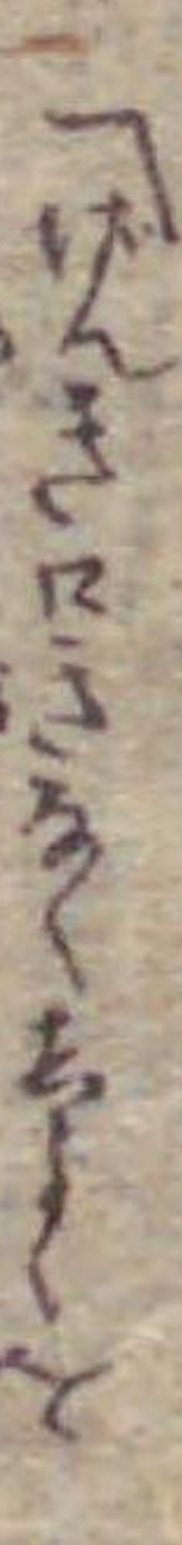〽げんき口きなくしよくを
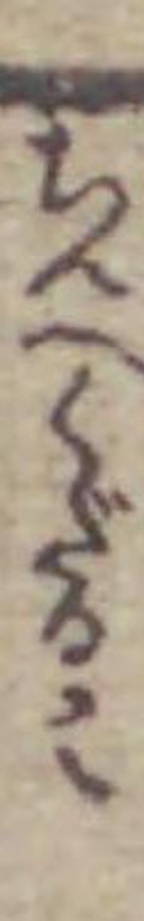ちんへくだる也
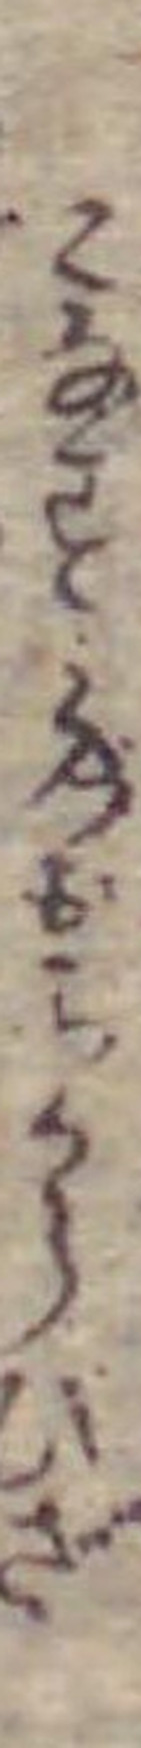こなすみづおちからひざ
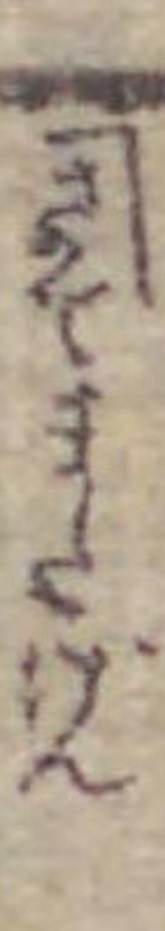〽さてまたげん
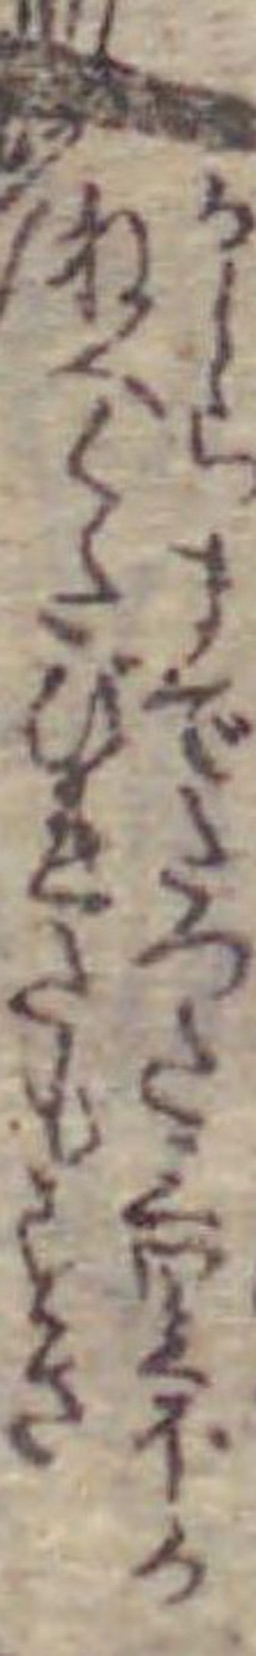ねへくたびれたもすき
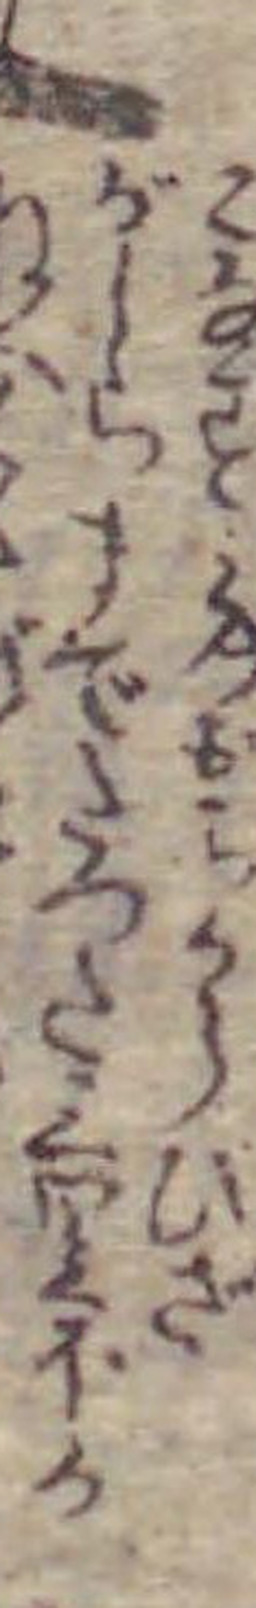がしらまでたつた三里ほか
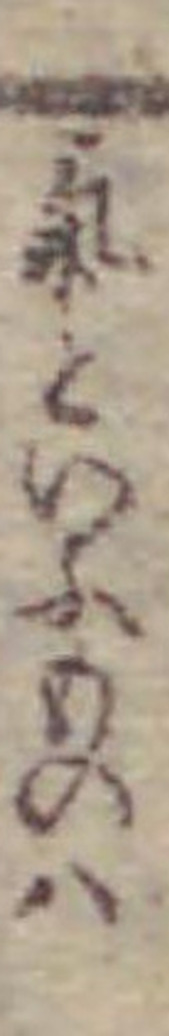気といふものは
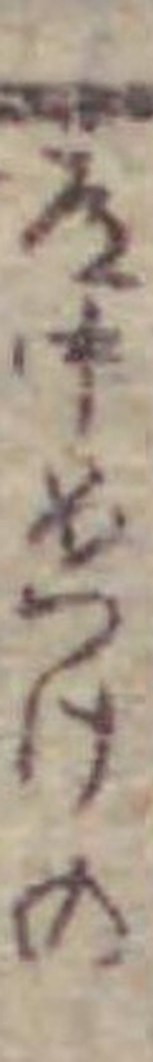道中めつけの
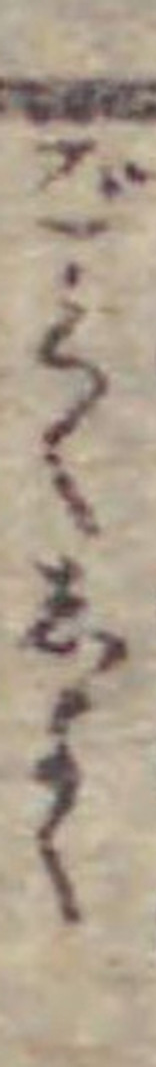ごとくしよく
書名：鼻下長生薬 : 3巻
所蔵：国立国会図書館 National Diet Library, JAPAN
